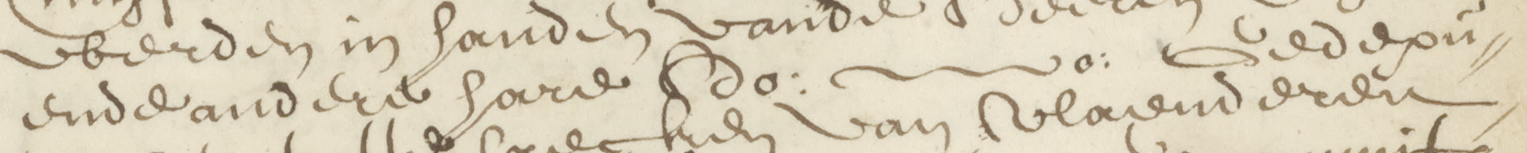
ende andere hare Ho: Mo: Gedepu„
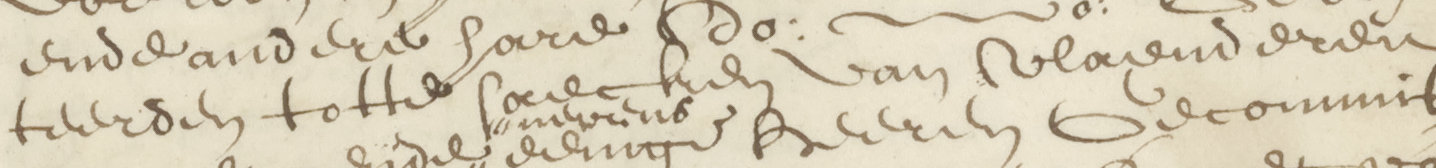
teerden totte saecken van Vlaenderen
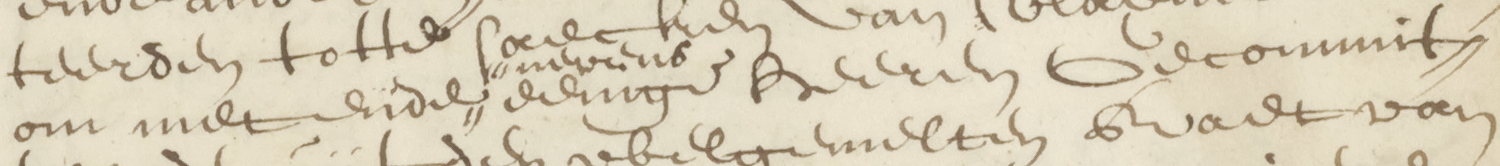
om met ende „ „nevens eenige Heeren Gecommit„
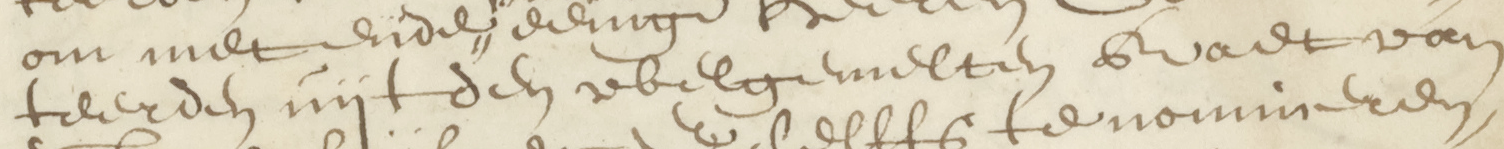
teerden uijt den welgemelten Raet van
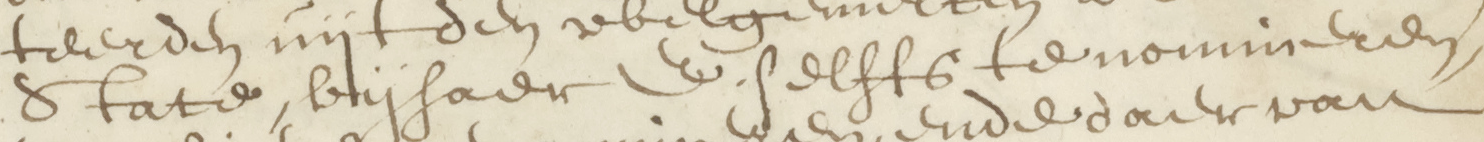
State, bij haer E: selffs te nomineren,
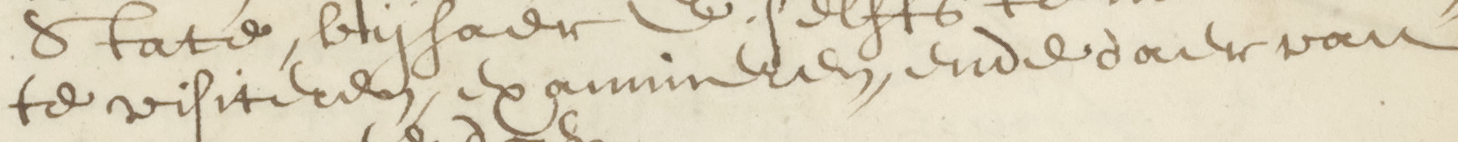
te visiteren, examineren, ende daer van
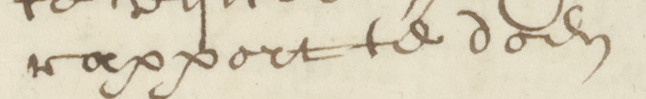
rapport te doen
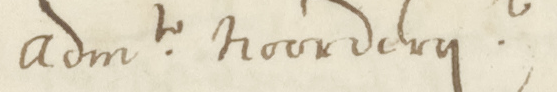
Admt. Noorderqr.
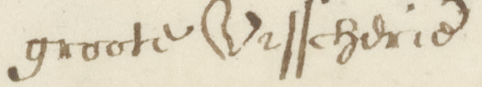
groote Visscherie
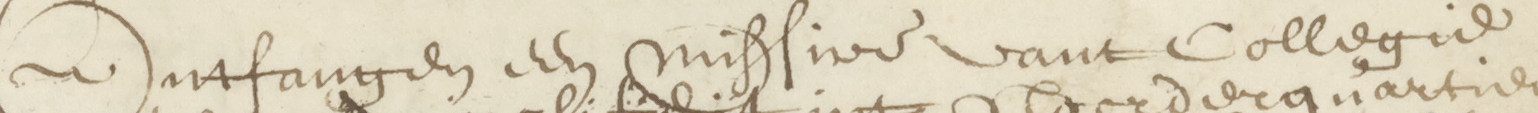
Ontfangen een missive vant Collegie
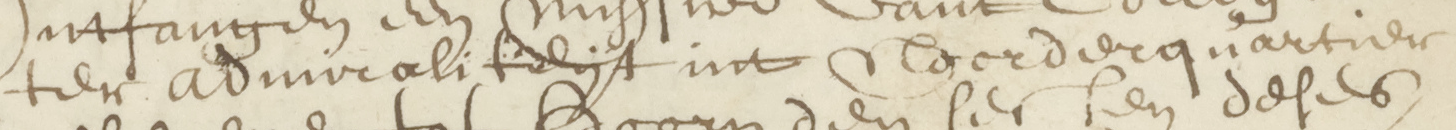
ter Admiraliteijt int Noorderquartier
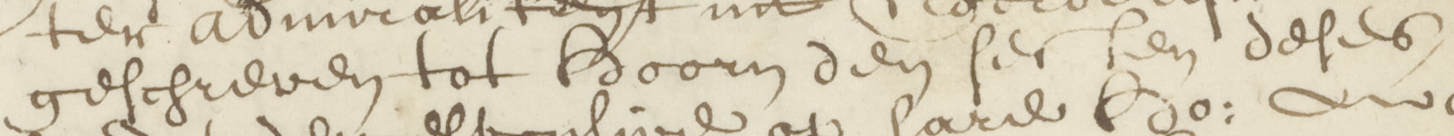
geschreven tot Hoorn den sesten deses
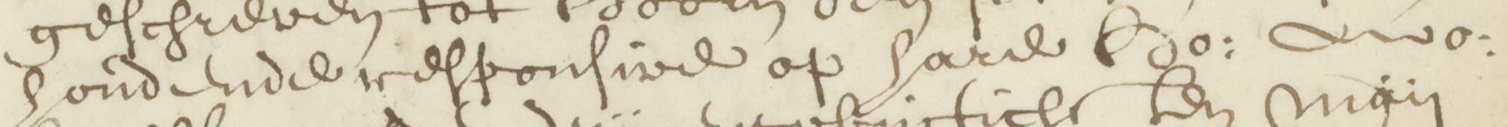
houdende responsive op hare Ho: Mo:
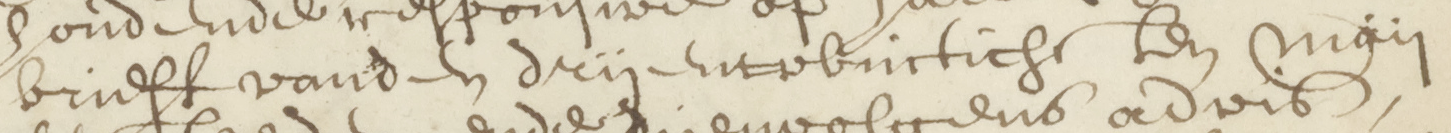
brieff vanden drijentwintichsten maij
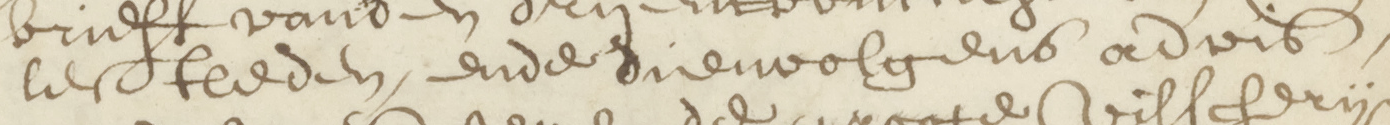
lestleden, ende dienvolgens advis,
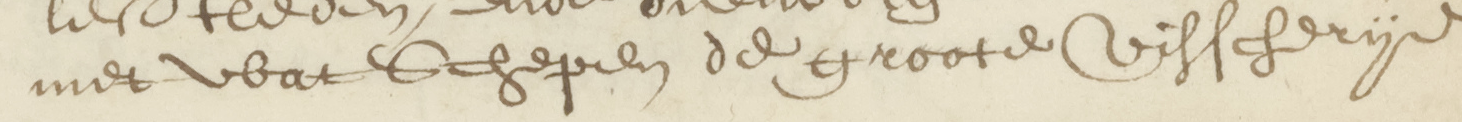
met wat Schepen de groote Visscherije
